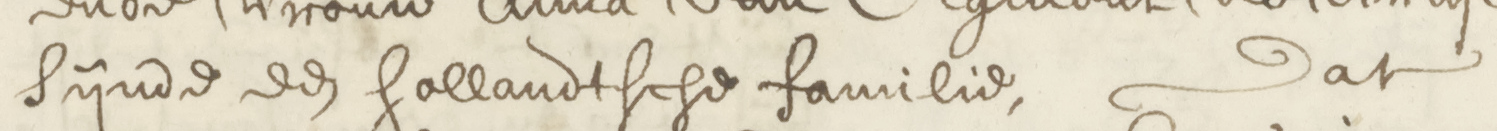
sijnde een hollandtsche familie. Dat
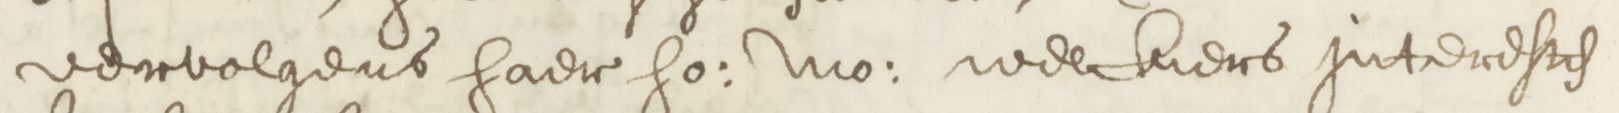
vervolgens haer ho:Mo: welckers interesten
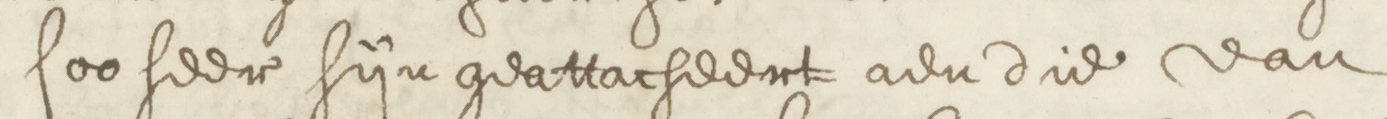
soo seer sijn geattacheert aen die van
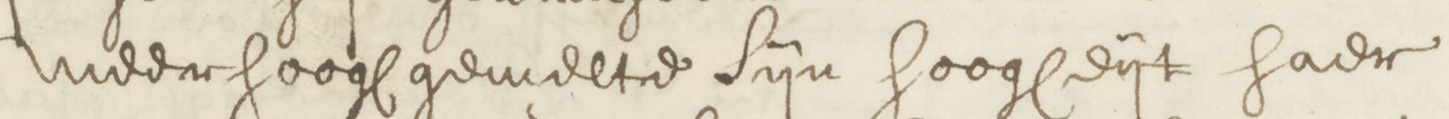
meerhooghgemelte Sijn hoogheijt haer
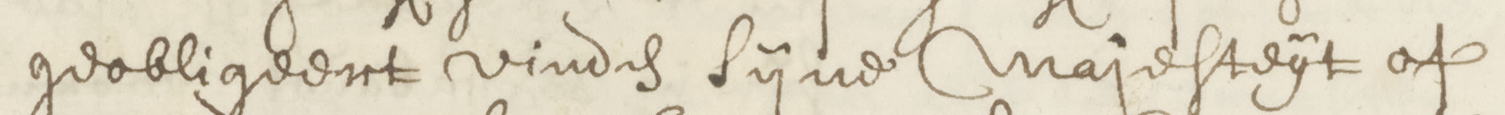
geobligeert vinden Sijne Majesteijt op
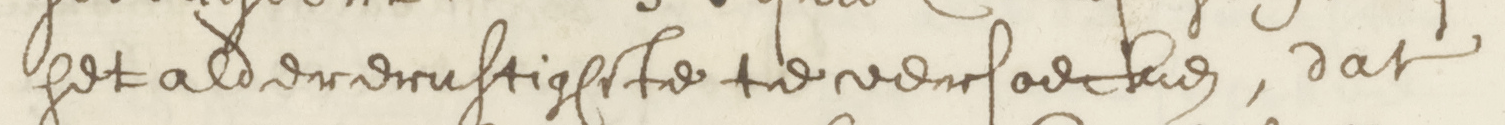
het alderernstighste te versoecken, dat
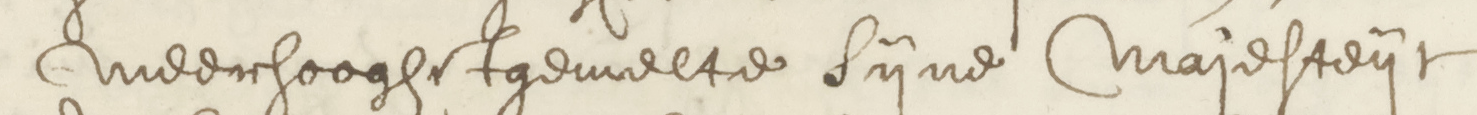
meerhooghstgemelte Sijne Majesteijt
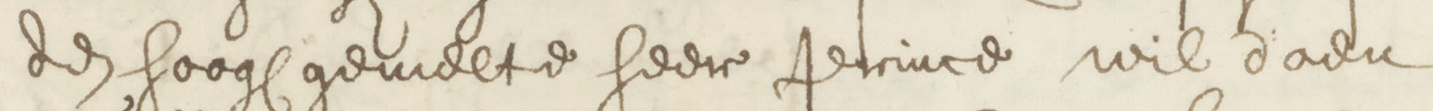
den hooghgemelte heer Prince wil doen
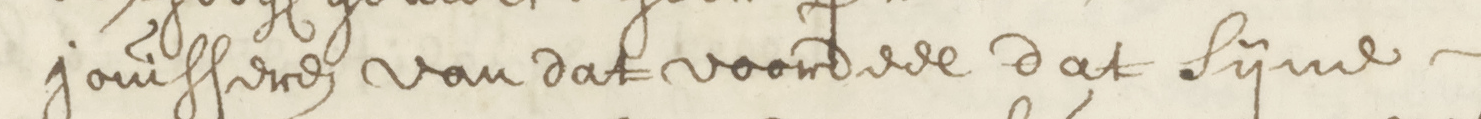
jouisseren van dat voordeel dat Sijne
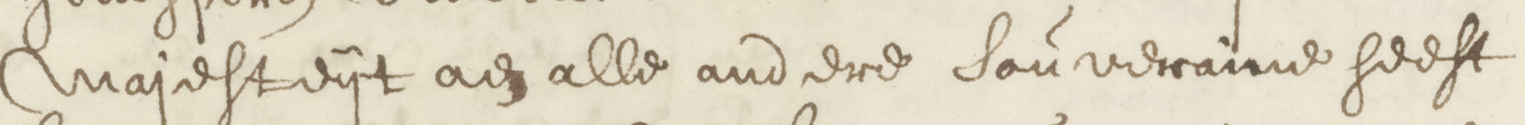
Majesteijt aen alle andere Souveraine heeft
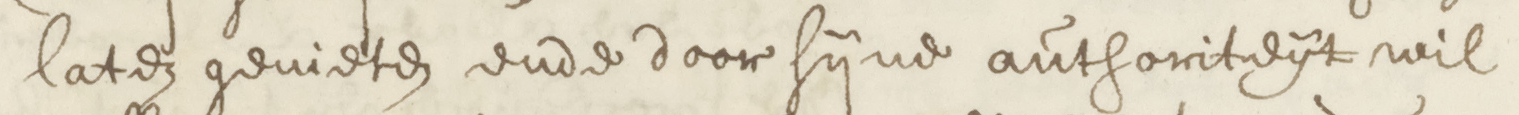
laten genieten ende door sijne authoriteijt wil
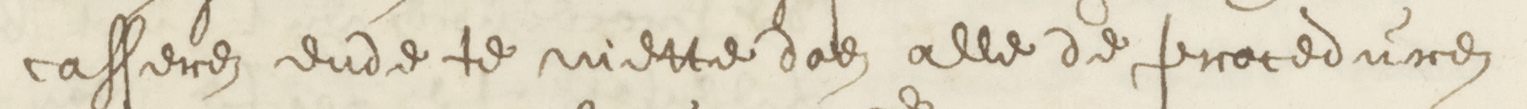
casseren ende te niette doen alle de proceduren
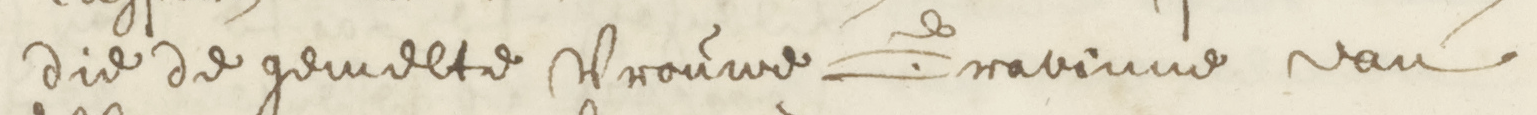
die de gemelte Vrouwe Gravinne van
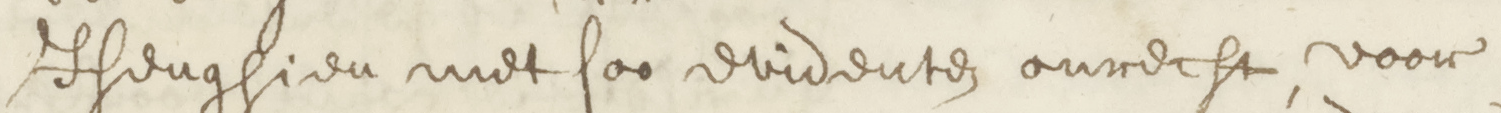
Isenghien met soo evidenten onrecht voor
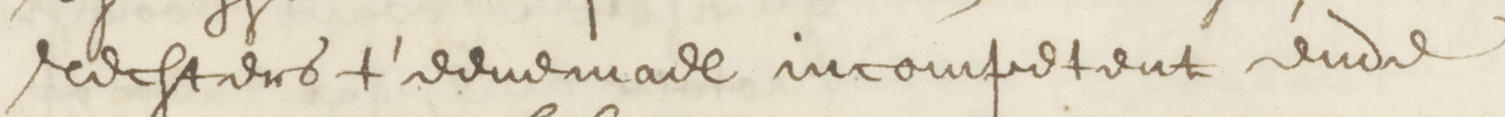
rechters t‛eenemael incompetent ende
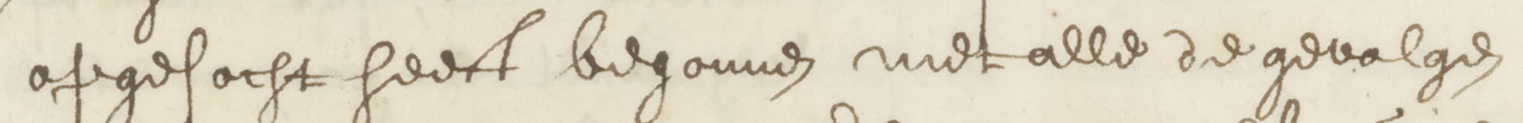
opgesocht heeft begonnen met alle de gevolgen
